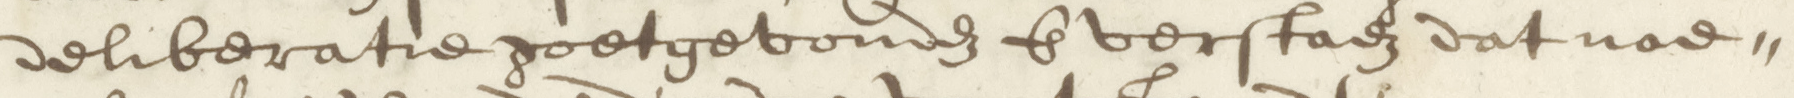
deliberatie goetgevonden & verstaen dat nae„
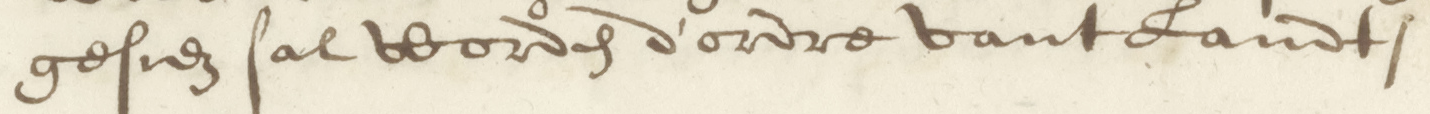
gesien sal worden d'ordre vant Landt.
